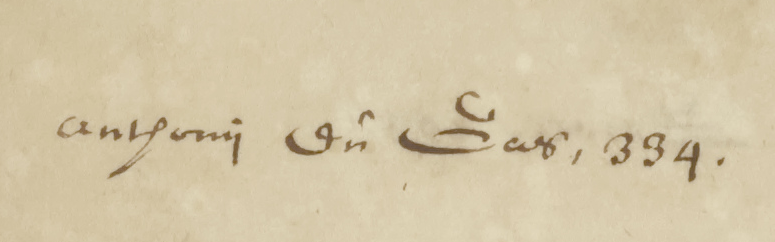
Anthonij du Gas, 334.
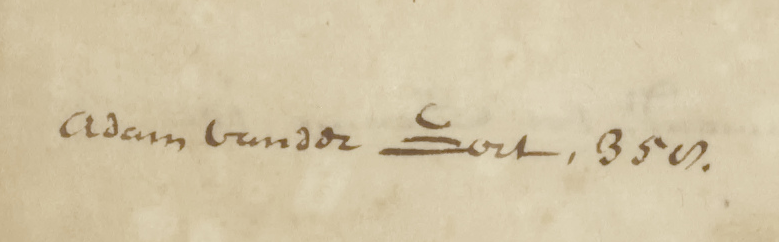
Adam vander Gort, 358.
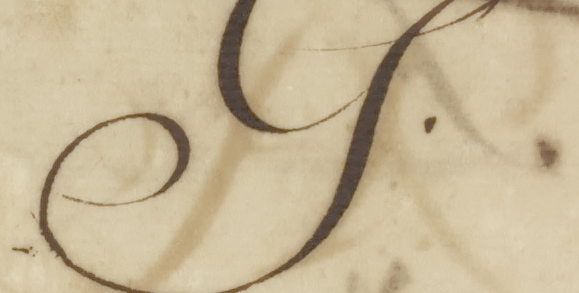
G.
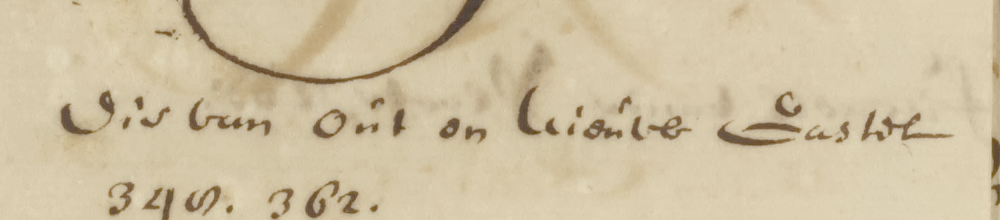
Die van Out on Nieuw Gastel
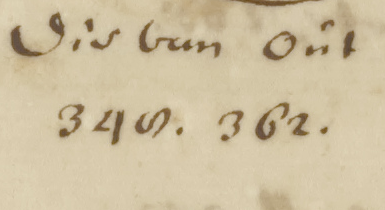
348. 362.
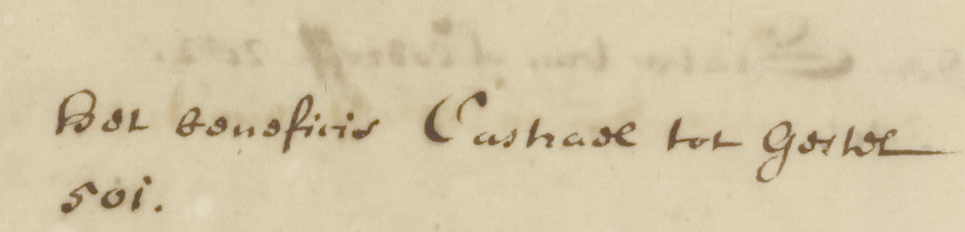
het beneficie Castrael tot Gestel
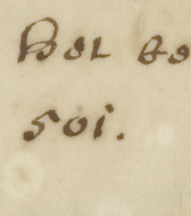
501.
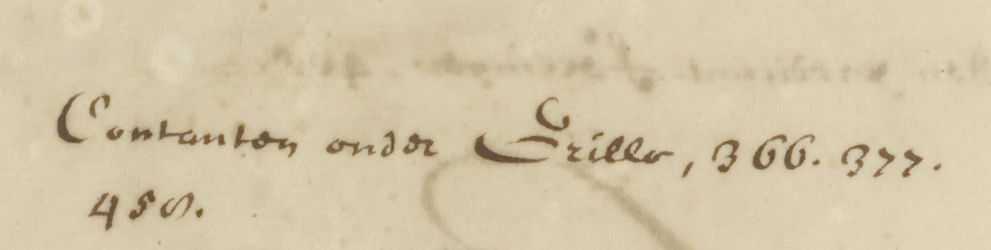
Contanten onder Grillo, 366. 377.
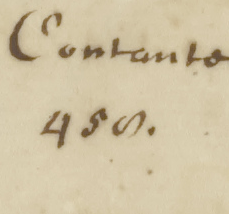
458.
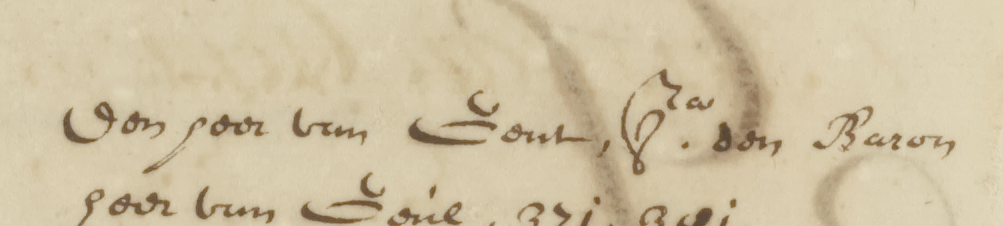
Den heer van Gent ca. den Baron
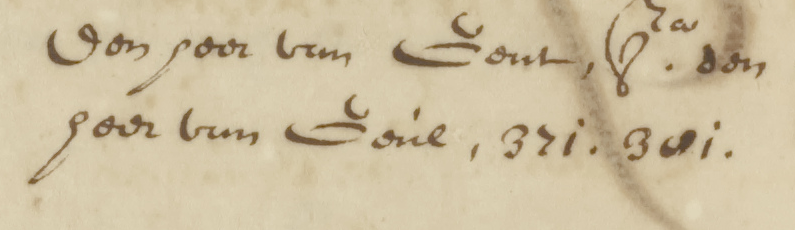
heer van Geul, 371. 381.
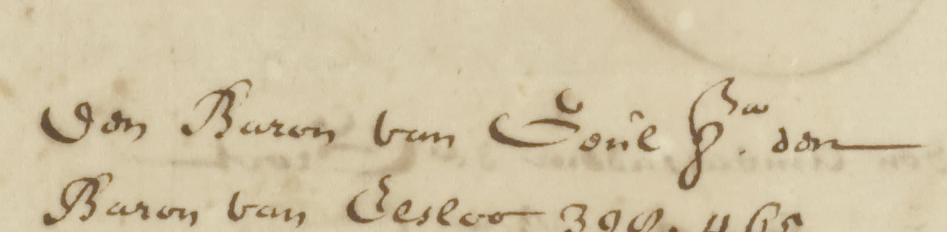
Den Baron van Geul, 405. 423.
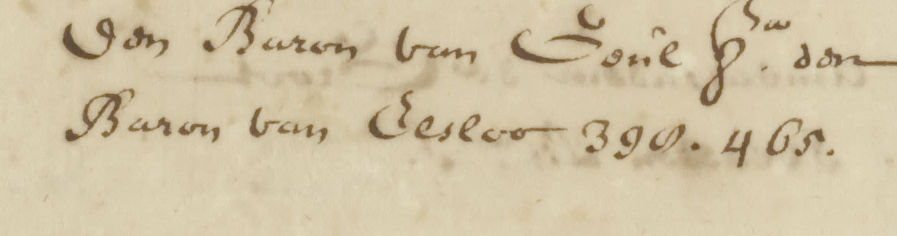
Baron van Elsloo, 398, 465.
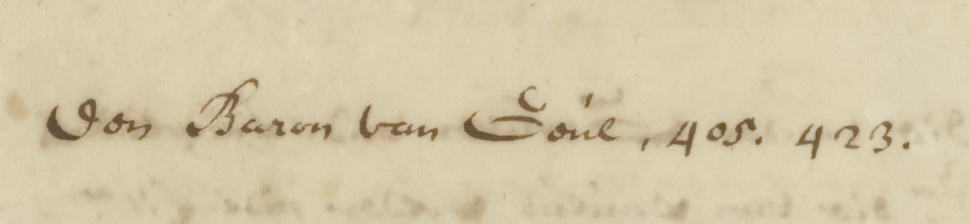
Den Baron van Geul, 405, 423.
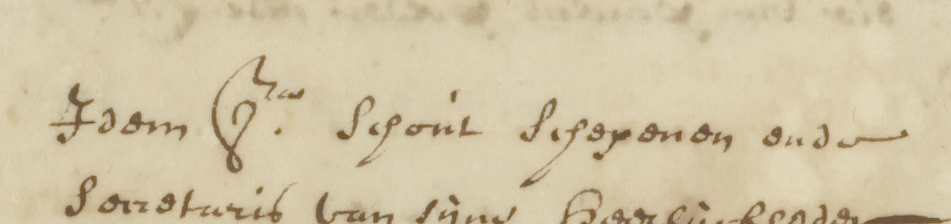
Idem ca. Schout Schepenen ende
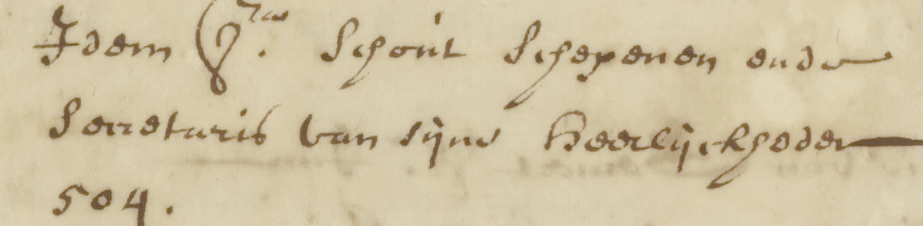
Secretaris van sijne heerlijckheden
